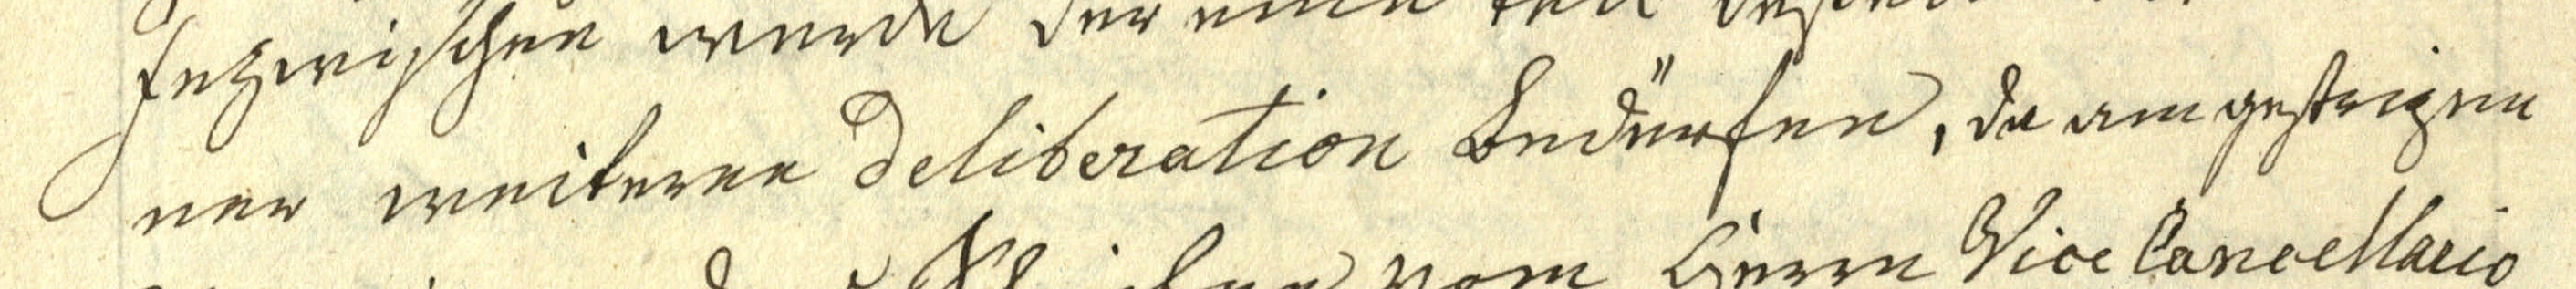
ner weiteren deliberation bedürfen, da am gestrigen
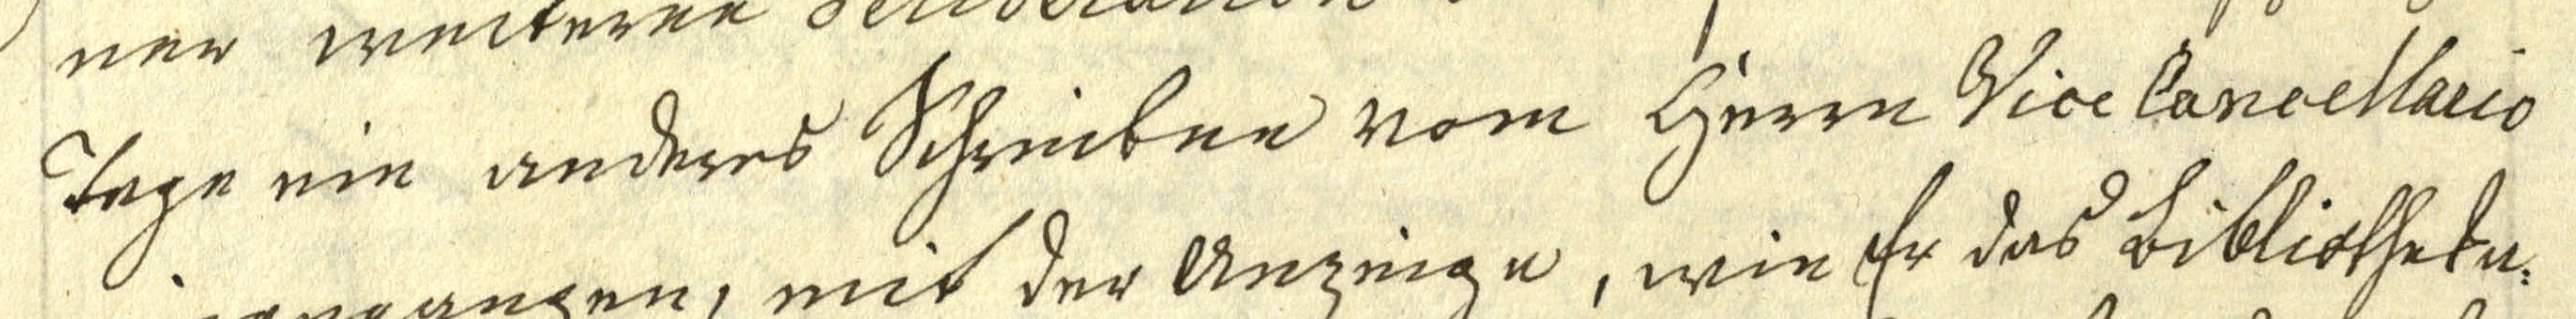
Tage ein anderes Schreiben vom Herrn Vice Cancellario
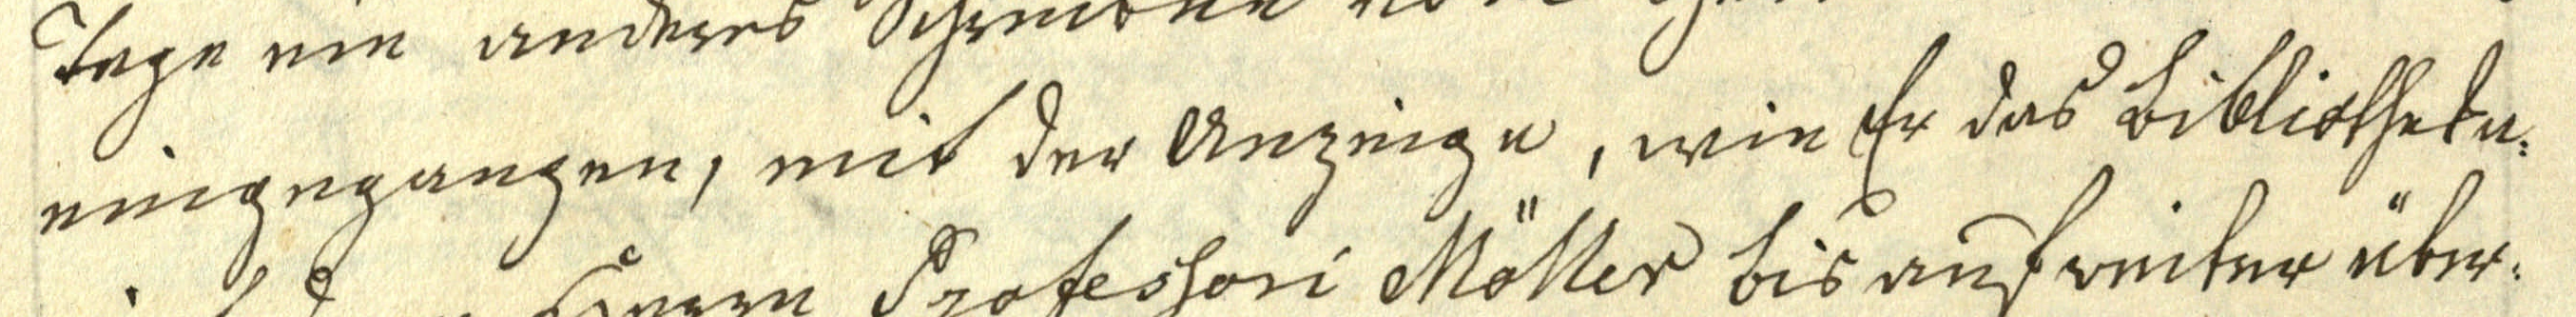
eingegangen, mit der Anzeige, wie Er das Bibliotheka
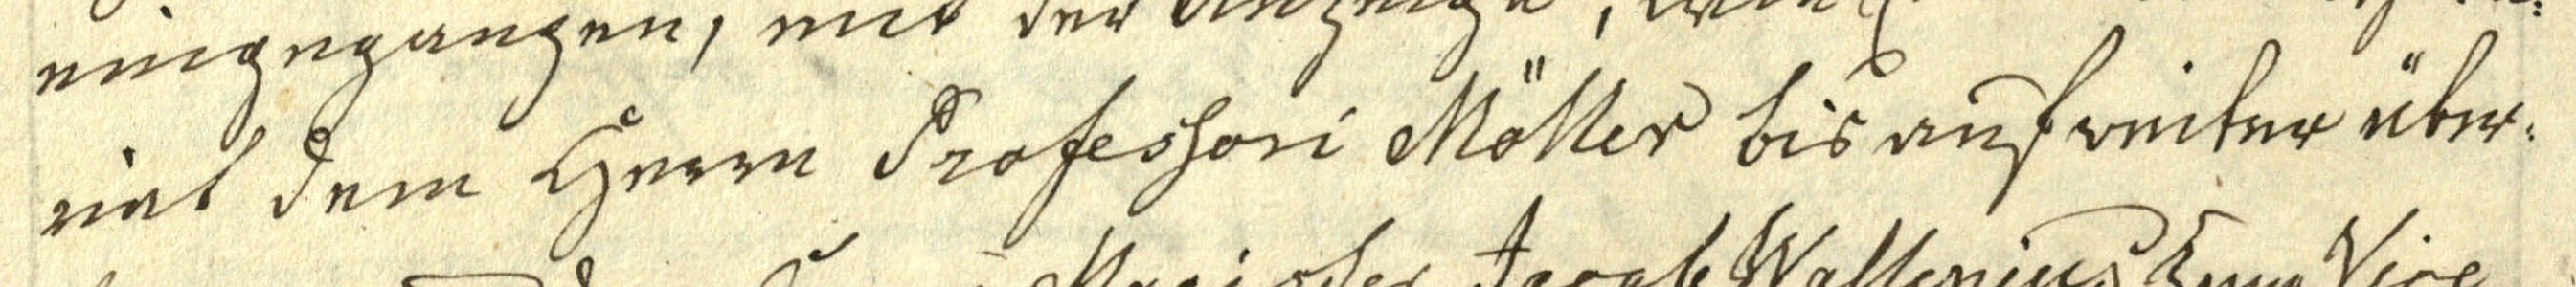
riat dem Herrn Professori Möller bis auf weiter über¬
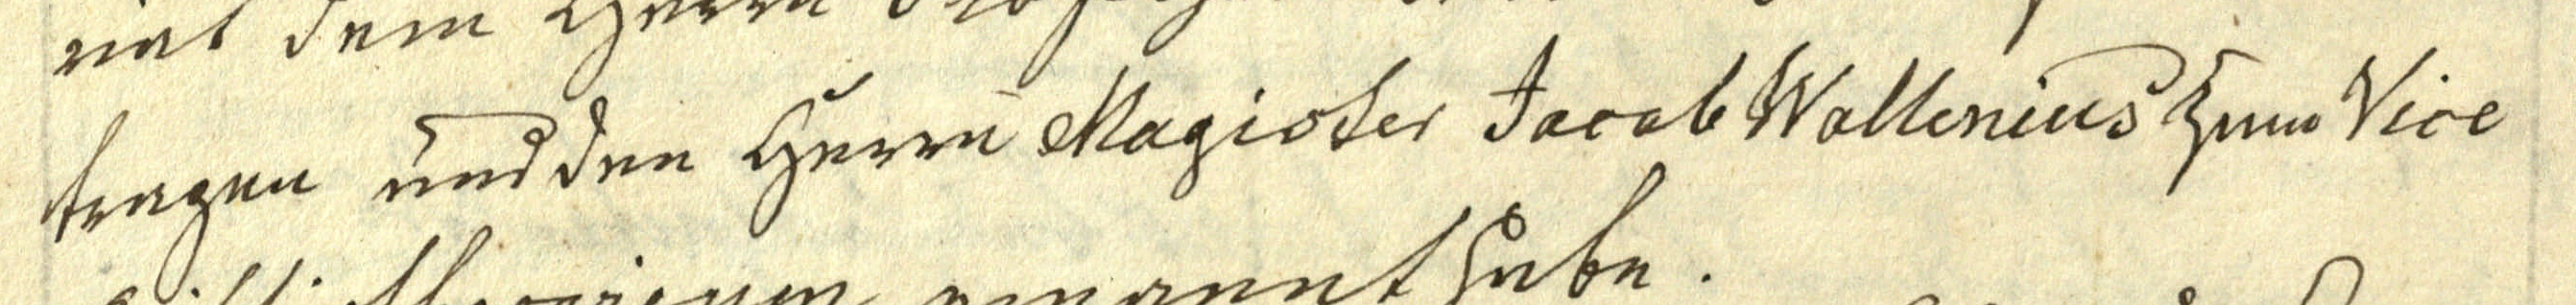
tragen und den Herrn Magister Jacob Wallenius zum Vice
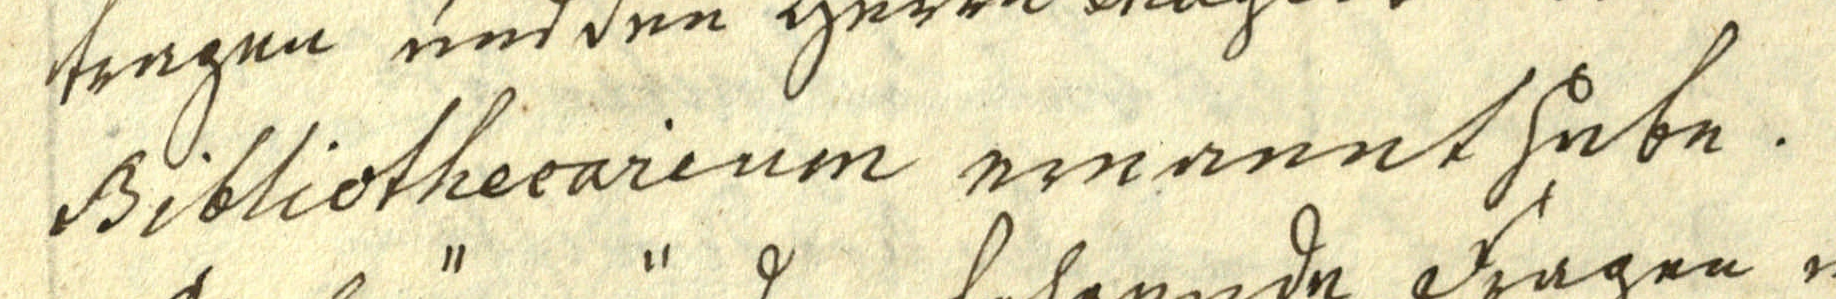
Bibliothecarium ernannt habe.
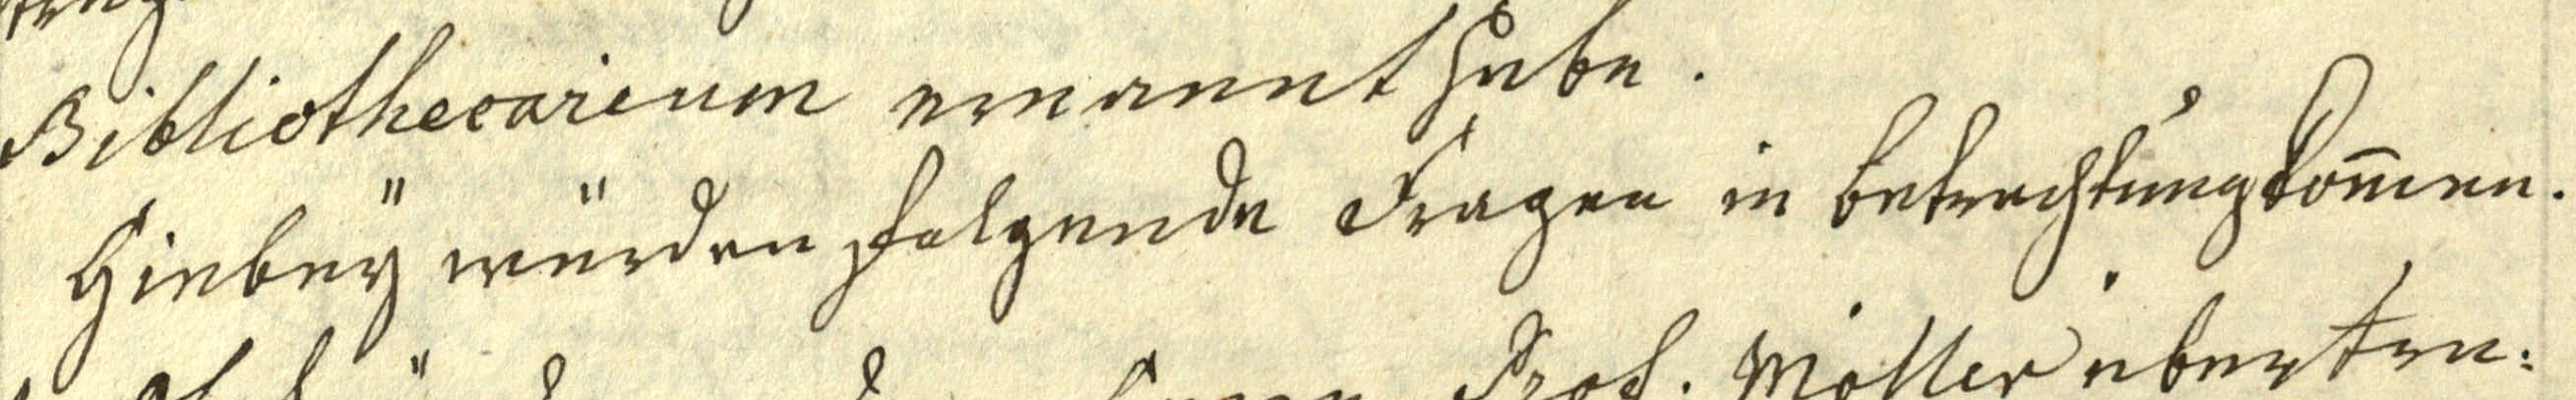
Hiebeÿ würden folgende Fragen in Betrachtung komen
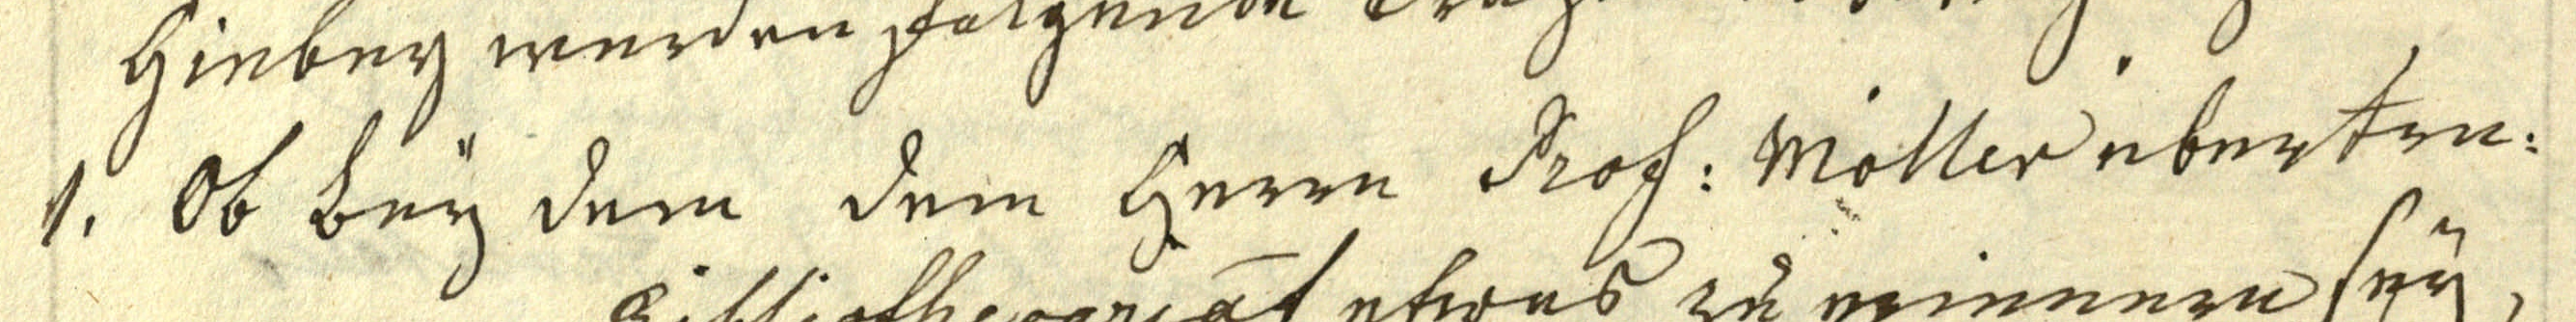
1. Ob beÿ dem dem Herrn Prof. Möller übertra¬
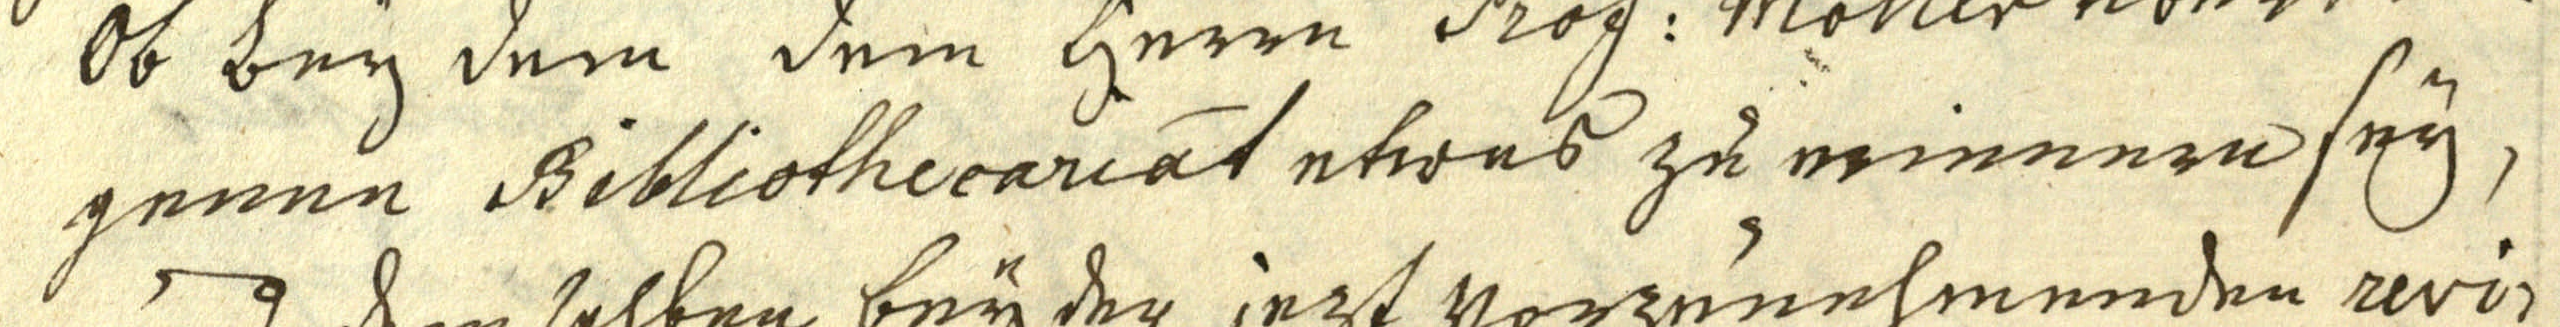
genen Bibliothecariat etwas zu erinnern seÿ,
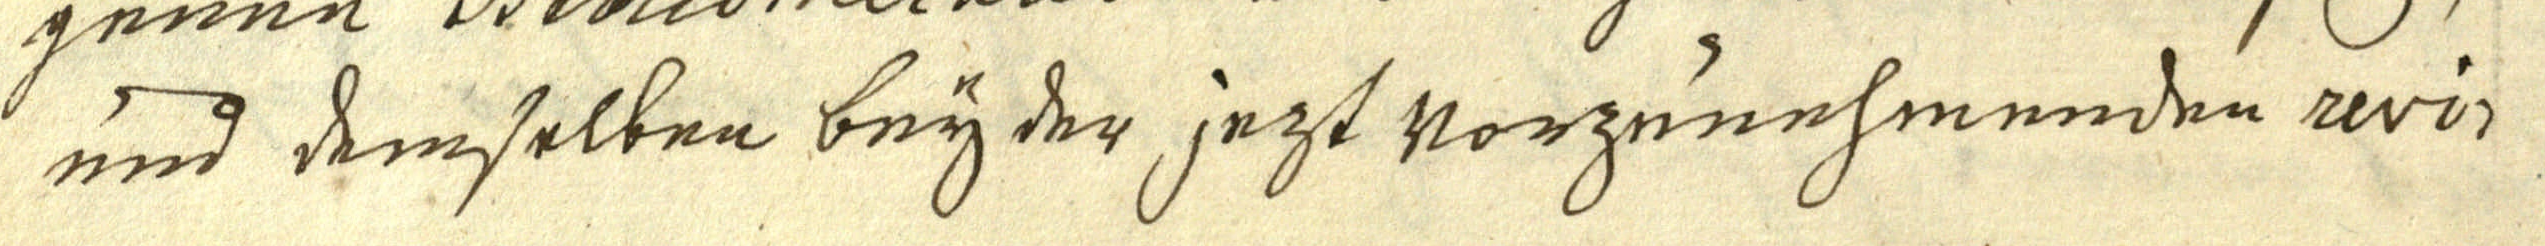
und demselben beÿ der jezt vorzunehmenden revi¬
